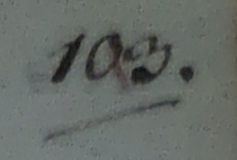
103.
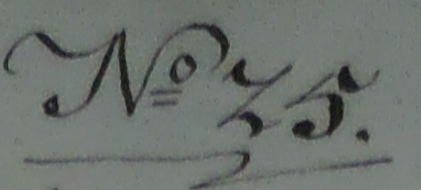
No͇ 25.
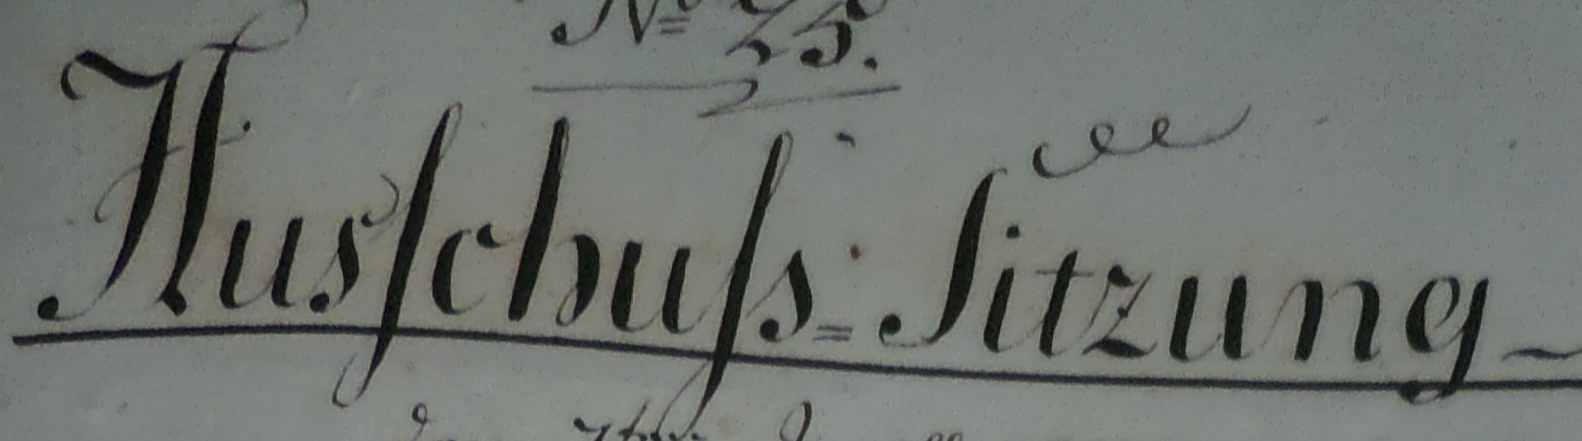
Ausschuss‗Sitzung
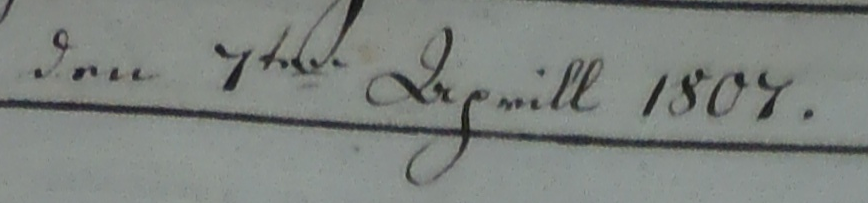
den 7t͇en Aprill 1807.
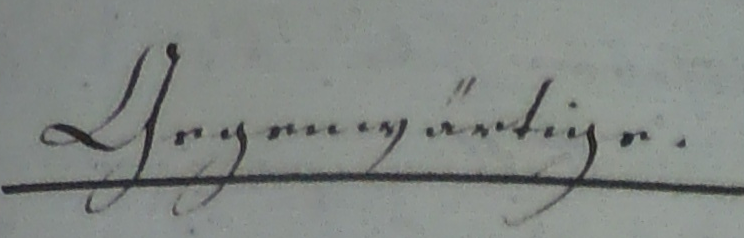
Gegenwärtige.
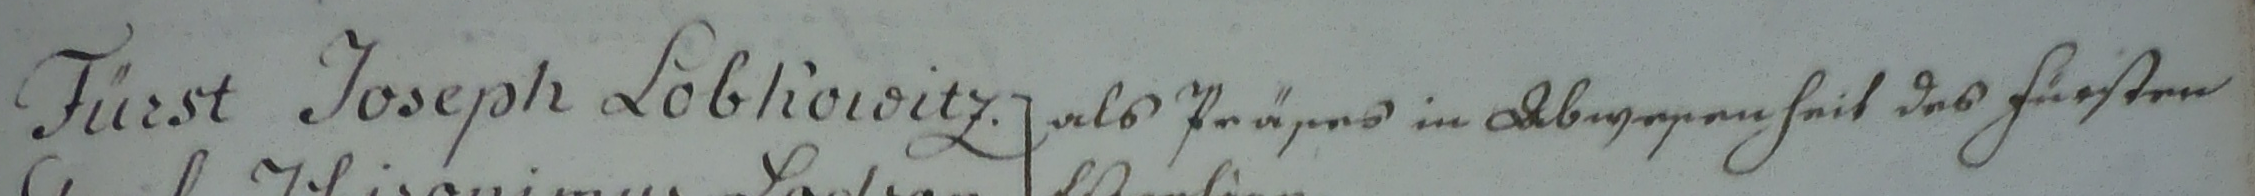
Fürst Joseph Lobkowitz. als Präses in Abwesenheit des Fürsten
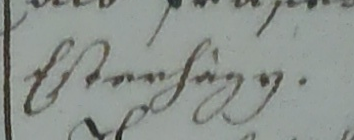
Esterhàzy.
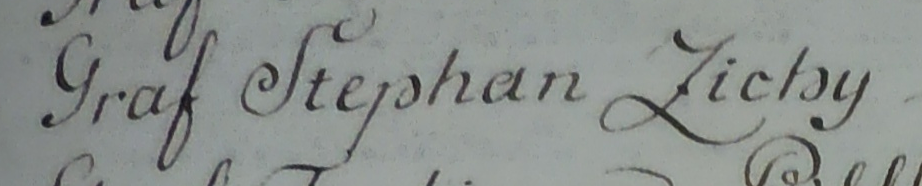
Graf Stephan Zichy
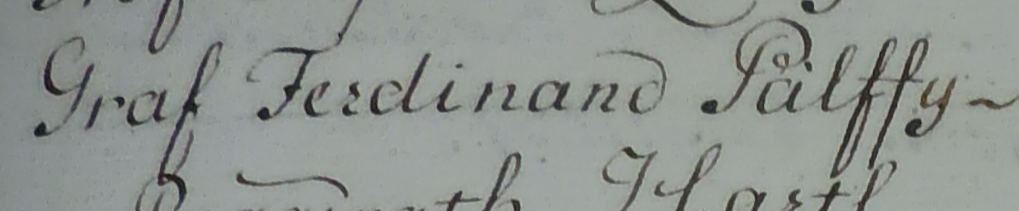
Graf Ferdinand Pàlffy.
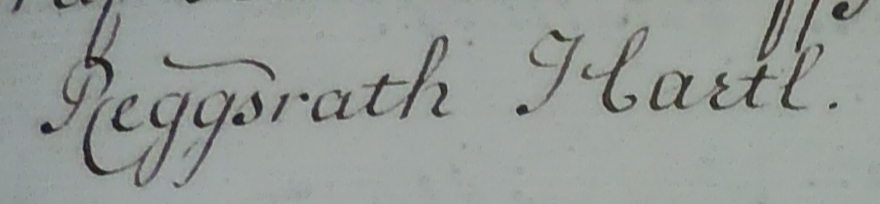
Reg͞gsrath Hartl.
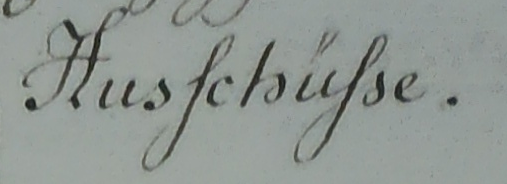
Ausschüsse.
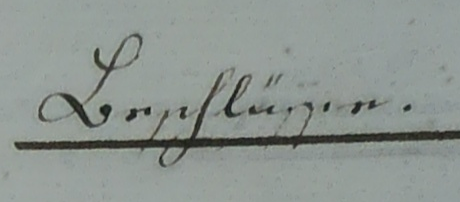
Beschlüsse.
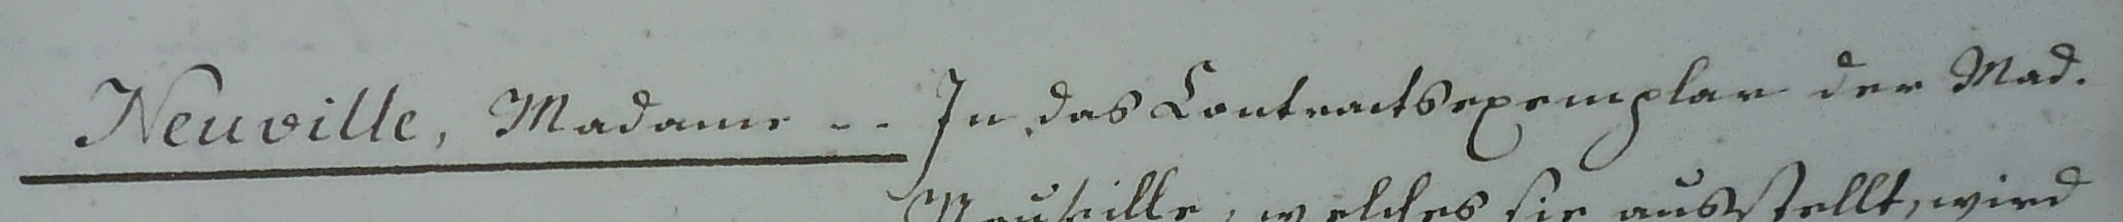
Neuville, Madame _ _ In das Contractsexemplar der Mad.
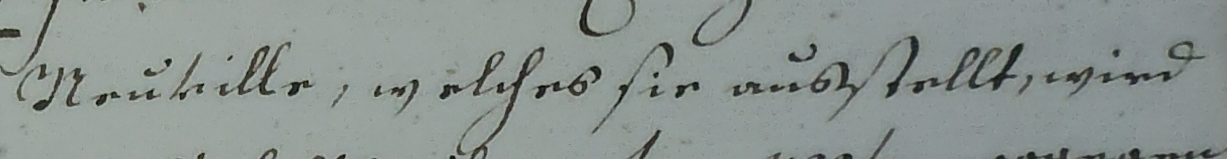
Neuville, welches sie ausstellt, wird
